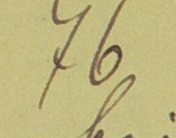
76
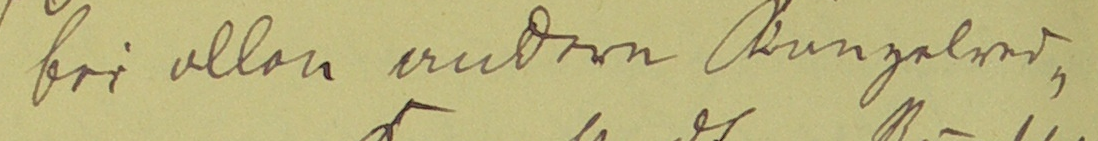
bei allen anderen Kanzelred¬
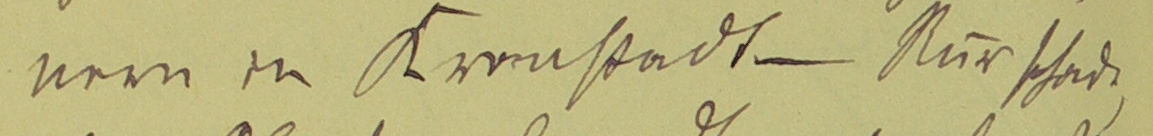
nern in Kronstadt—Nur schade
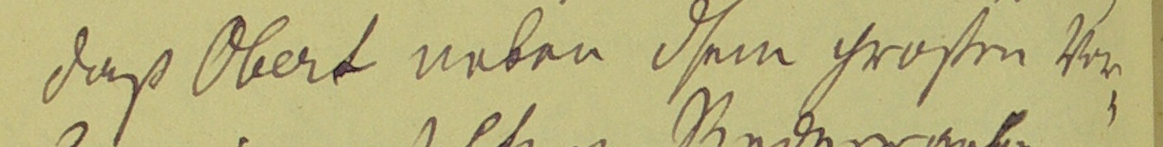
das Obert neben dem großen Vor¬
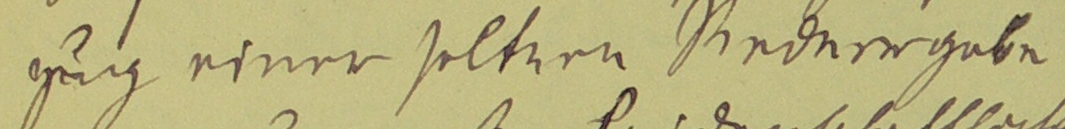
zug einer seltenen Rednergabe
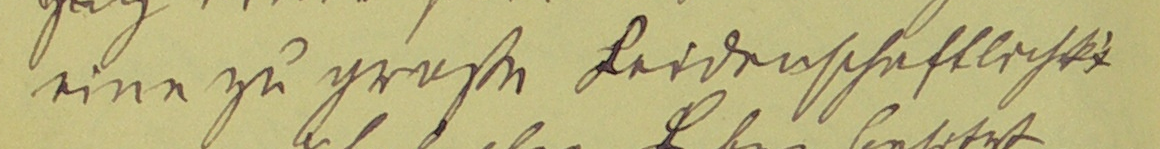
eine zu große Leidenschaftlichkeit
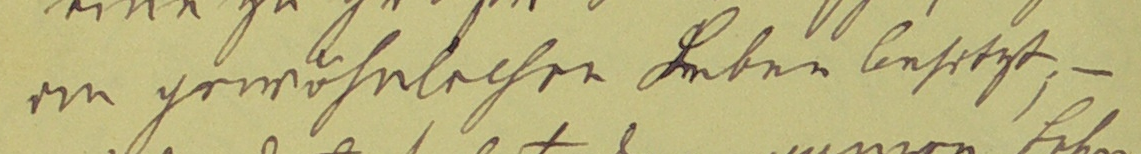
im gewöhnlichen Leben besitzt, -
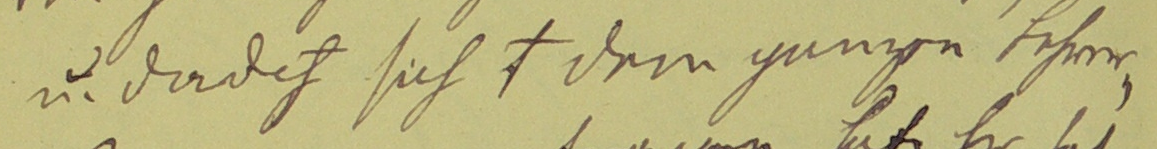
und dadurch sich mit dem ganzen Lehrer
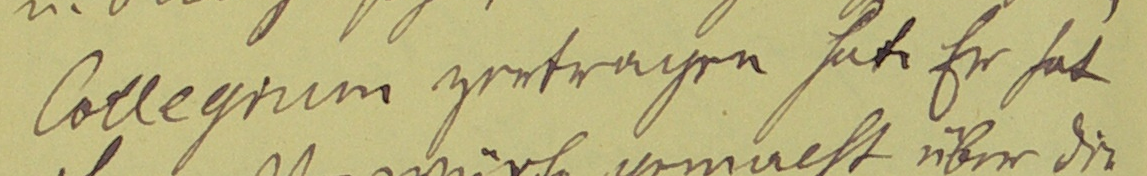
zertragen hat. Er hat
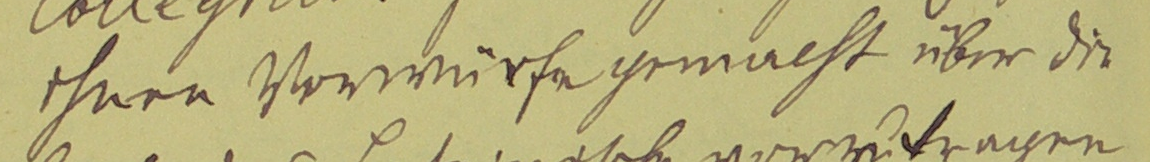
ihnen Vorwürfe gemacht über die
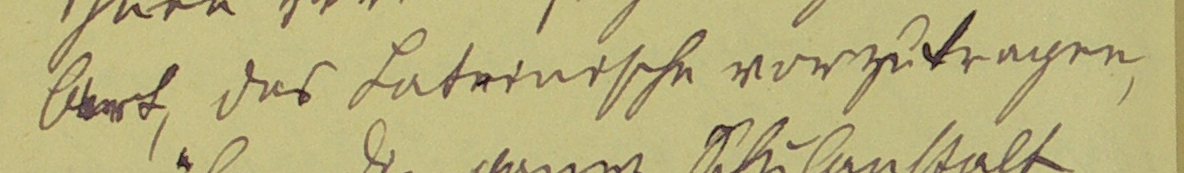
Art das Lateinische vorzutragen,
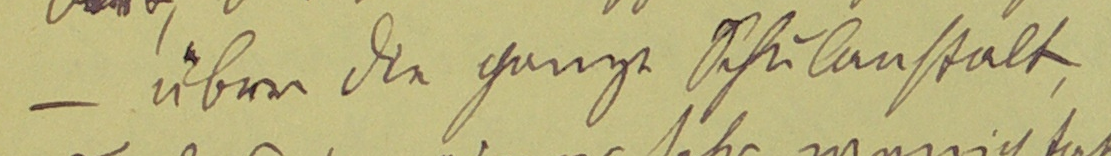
- über die ganze Schulanstalt ,
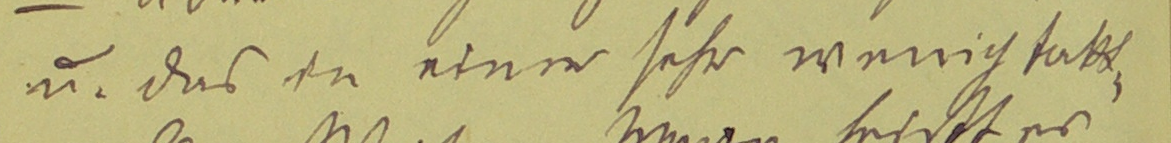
und das in einer sehr wenig takt¬
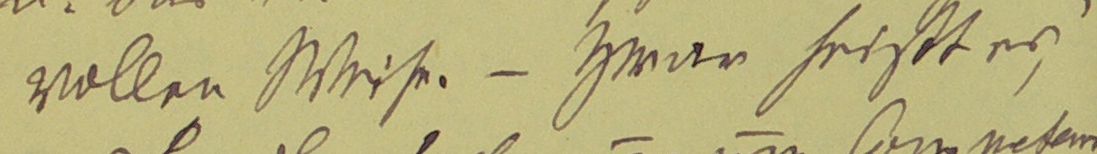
vollen Weise. - Zwar heißt es,
